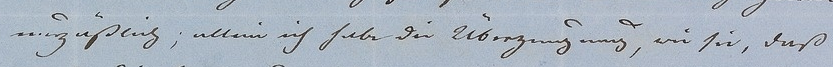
unpäßlich; allein ich habe die Überzeugung, wie sie, daß
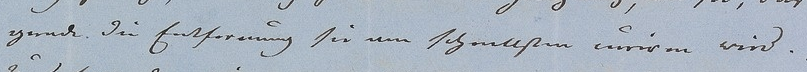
gerade die Entfernung sie am schnellsten curiren wird.
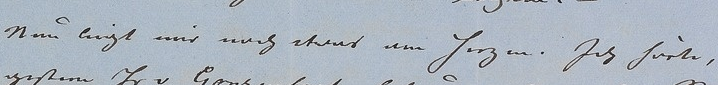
Nun liegt mir noch etwas um Herzen. Ich hörte,
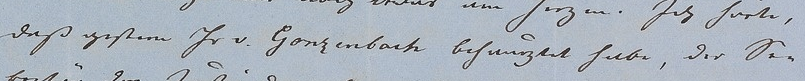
daß gestern Hr v. Gonzenbach behauptet habe, der Se-
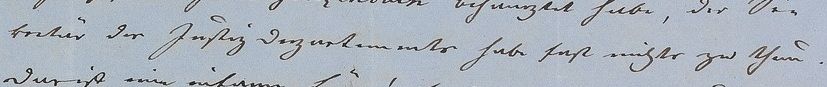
kretär des Justizdepartements habe fast nicht zu thun.
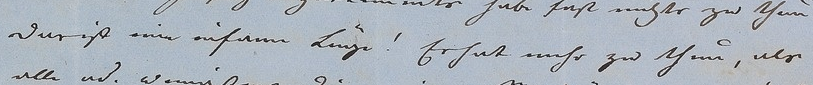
Das ist eine infame Lüge! Er hat mehr zu thun, als
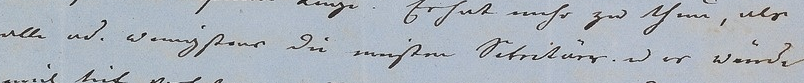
alle od. wenigstens die meisten Sekretäre u es würde
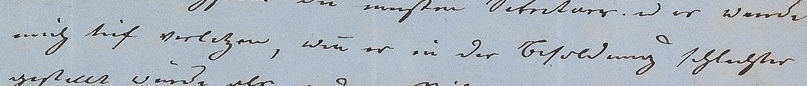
mich tief verletzen, wenn er in der Besoldung schlechter
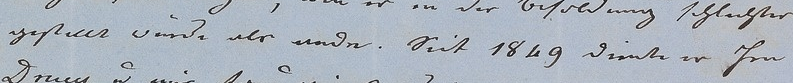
gestellt würde als andre. Seit 1849 diente er Hrn
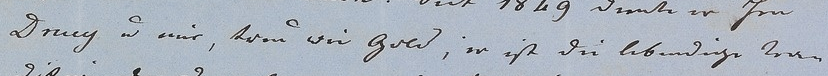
Druey u mir, treu wie Gold, er ist die lebendige Tra-
